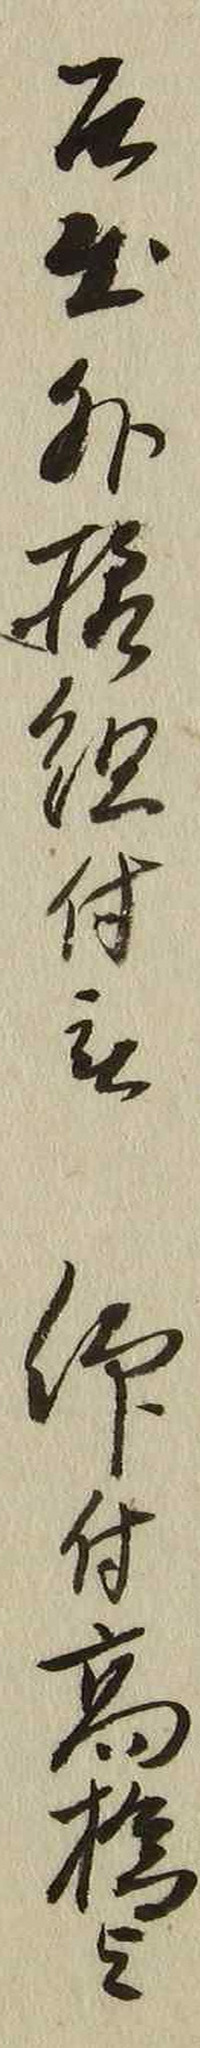召出外様組付被仰付高橋与
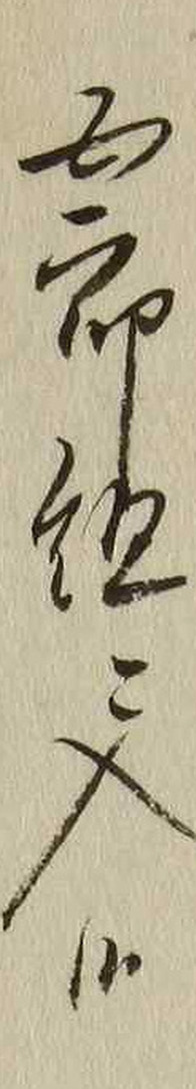五郎組ニ入候
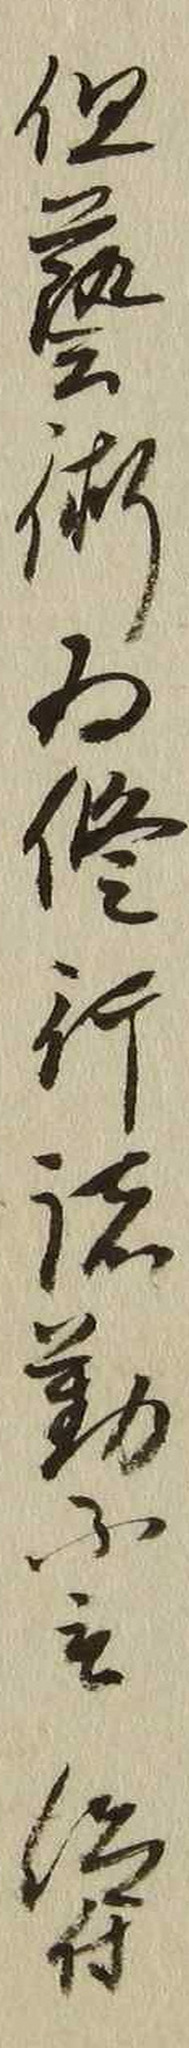但芸術為修行諸勤不被仰付
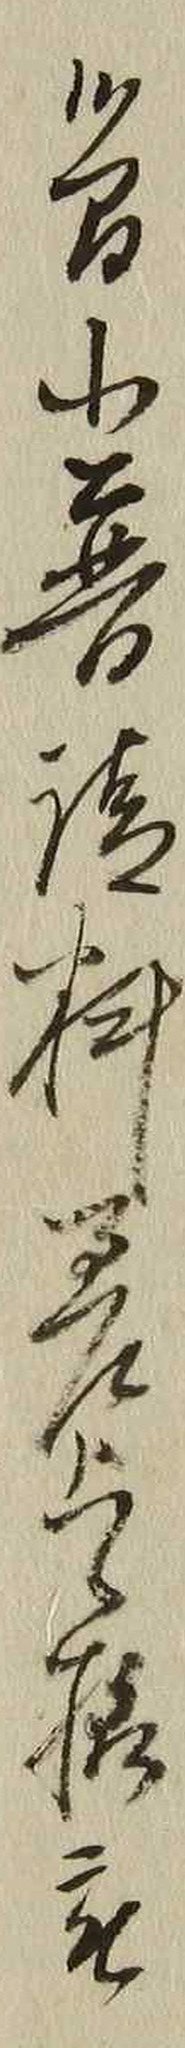候間小普請料差上候様被
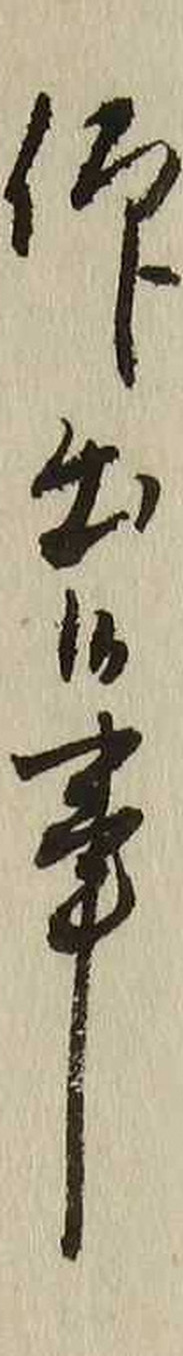仰出候事
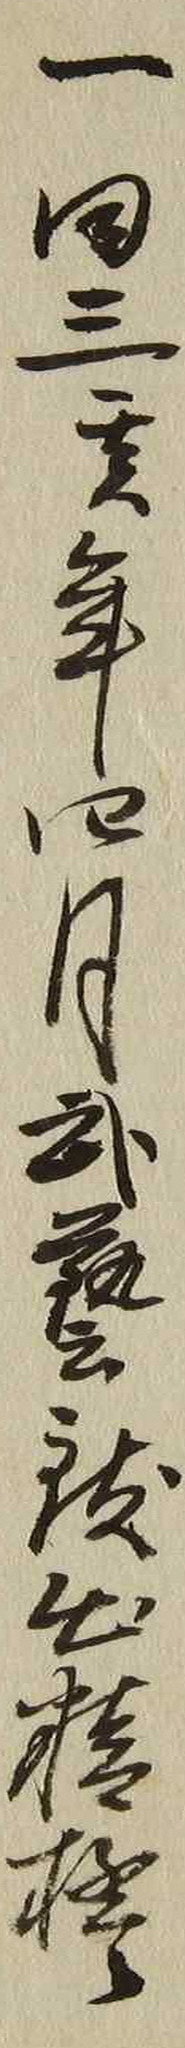一同三亥年四月武芸致出精極ノ
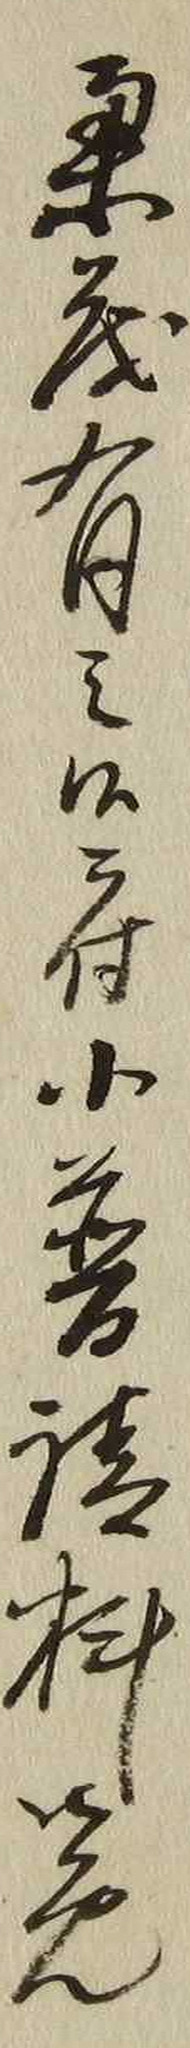柔茂有之候ニ付小普請料御免
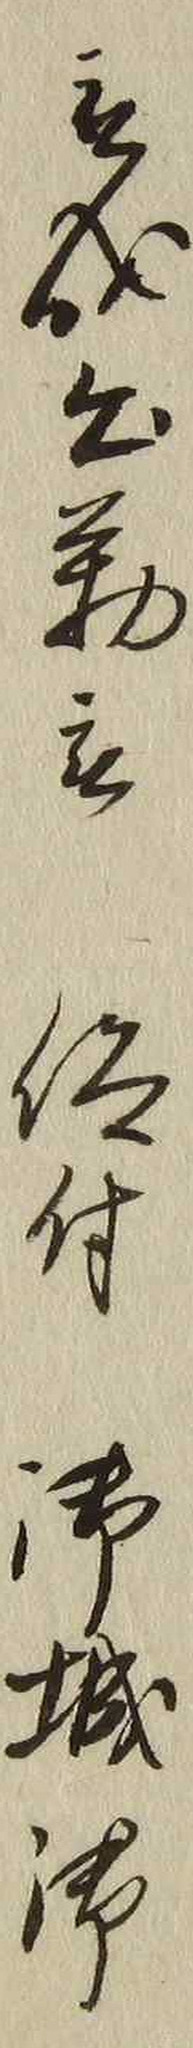被成出勤被仰付御城御
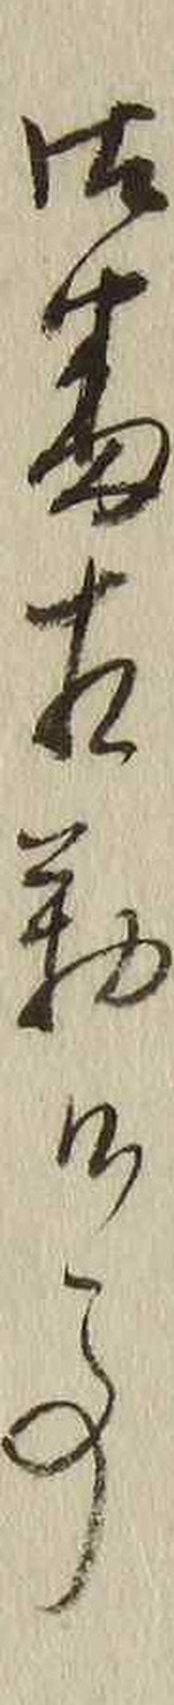御番相勤候事
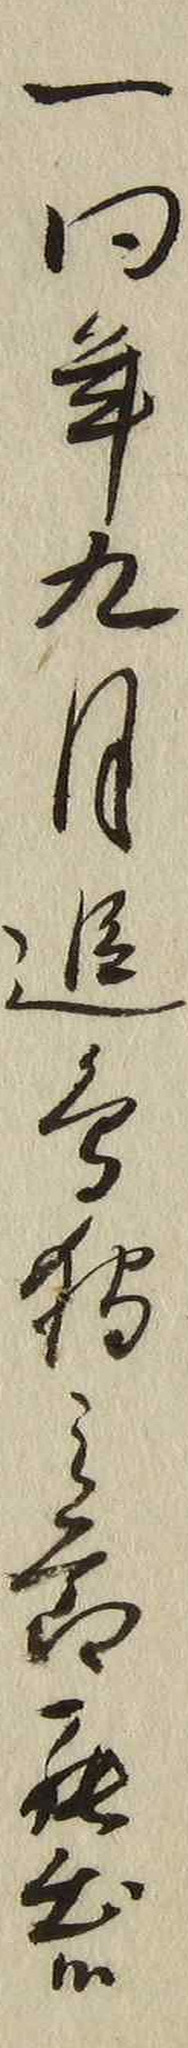一同年九月追鳥狩之節罷出候
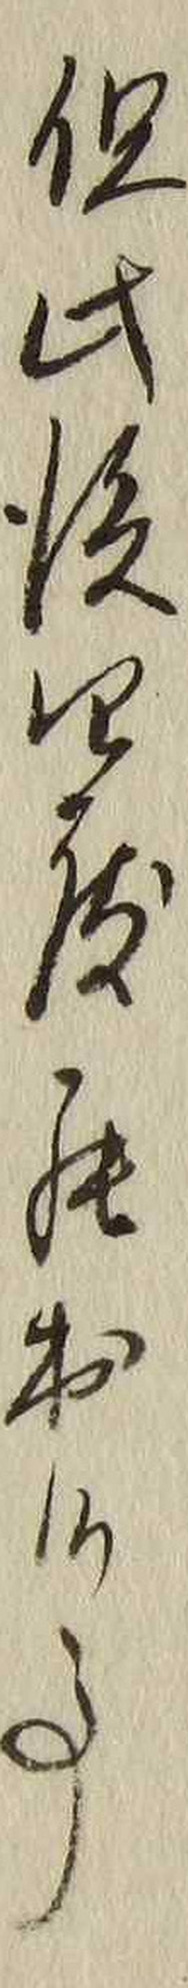但此後四度罷出候事
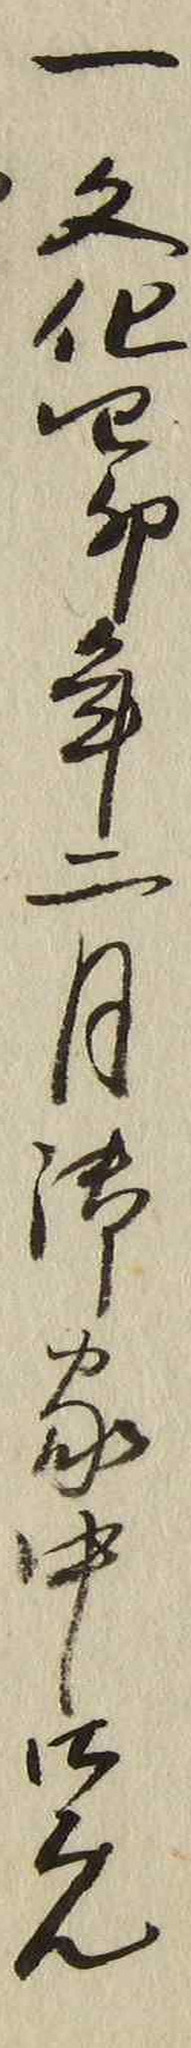一文化四卯年二月御家中御免
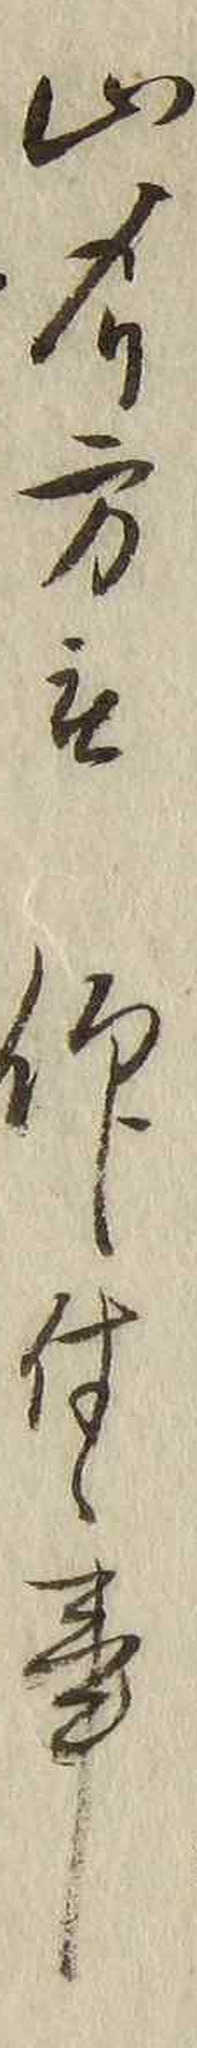山〆り方被仰付候事
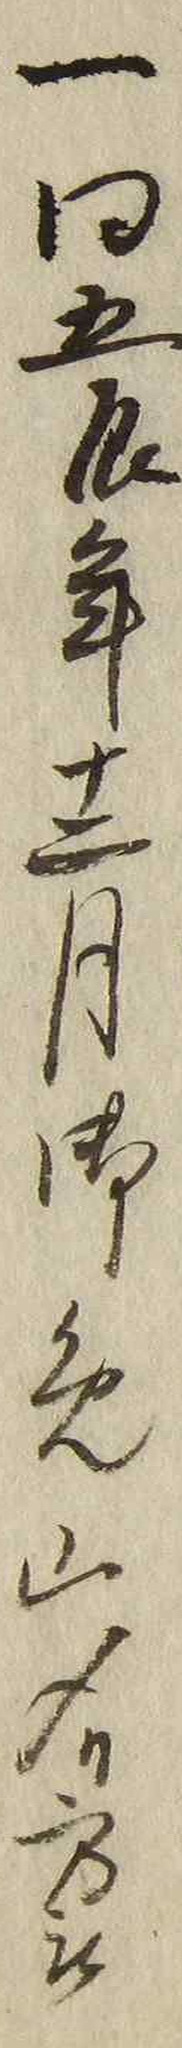一同五辰年十二月御免山〆り方被

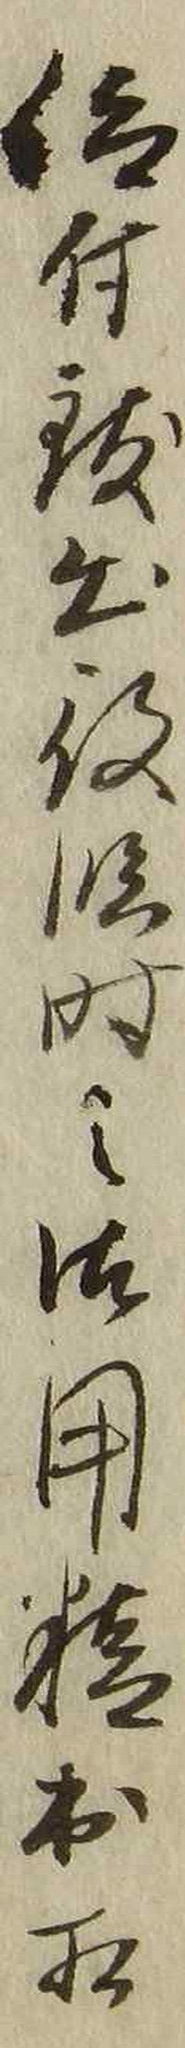仰付致出役臨時之御用精出相
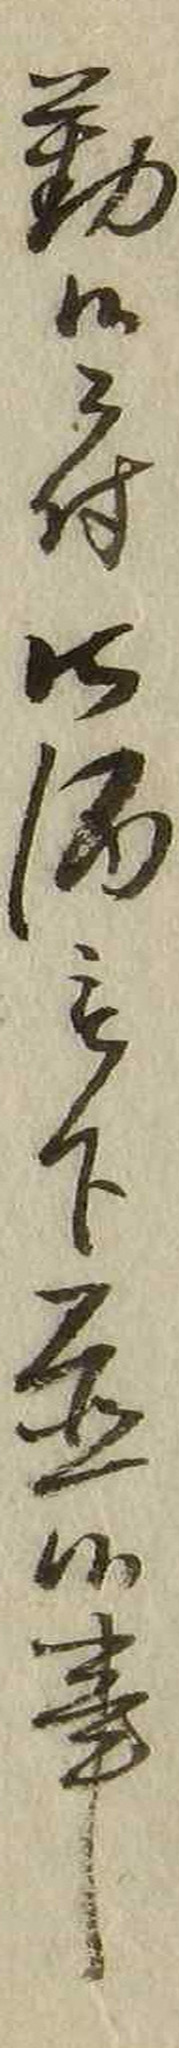勤候ニ付御酒被下置候事
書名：諸士系譜　巻之359　す之部9
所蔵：会津若松市立会津図書館
